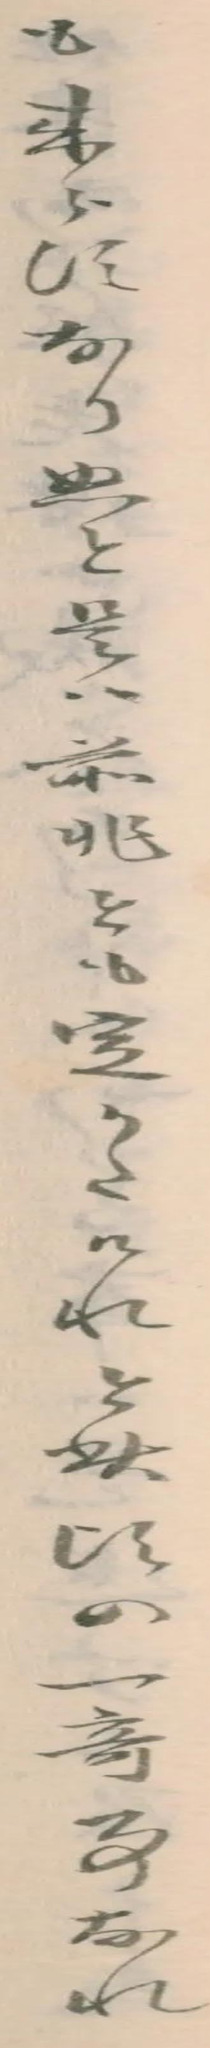も来らすなりぬと是は前兆とも定りたけれと此頃の一奇事なれ
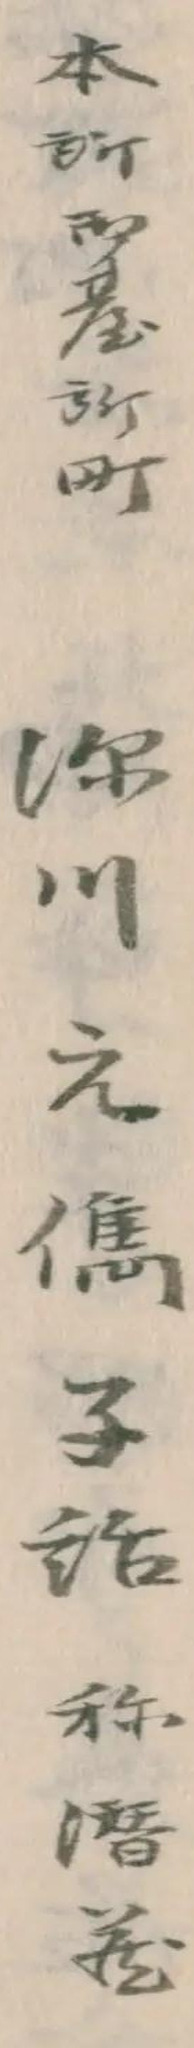本所御台所町深川元儁子話称潜蔵
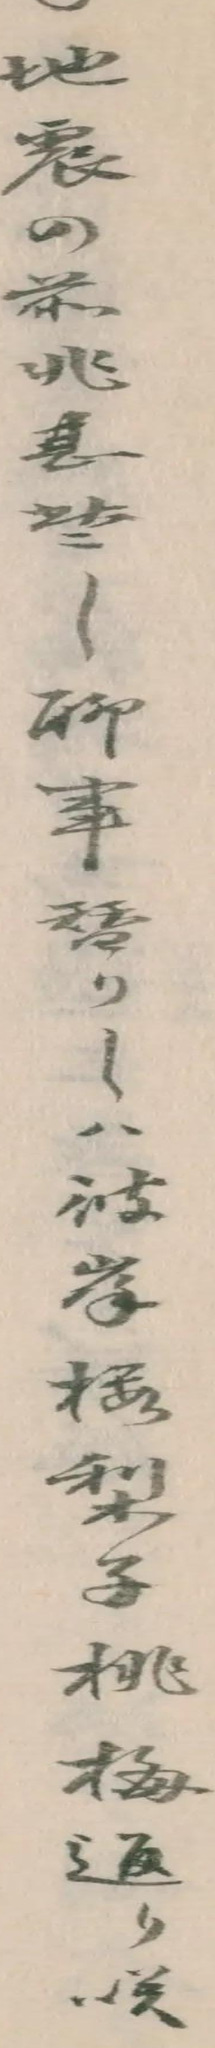〇地震の前兆甚些し聊事替りしは彼岸桜梨子桃梅返り咲
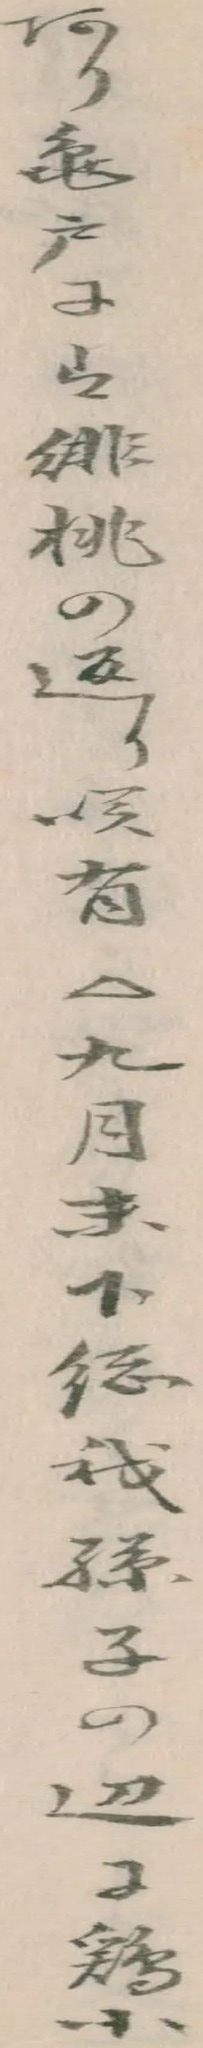あり亀戸には緋桃の返り咲有△九月末下総我孫子の辺に鶏小？
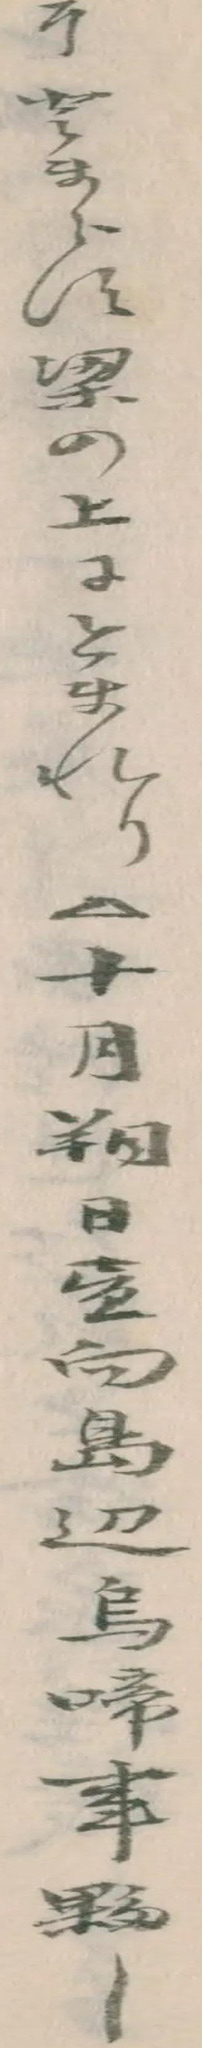にとまらす梁の上にとまれり△十月朔日昼向島辺烏啼事夥し
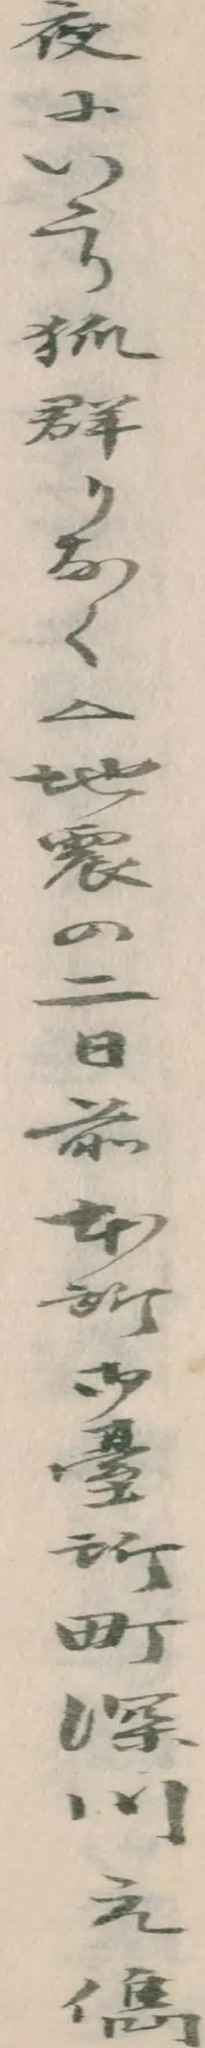夜にいたり狐群りなく△地震の二日前本所御台所町深川元儁
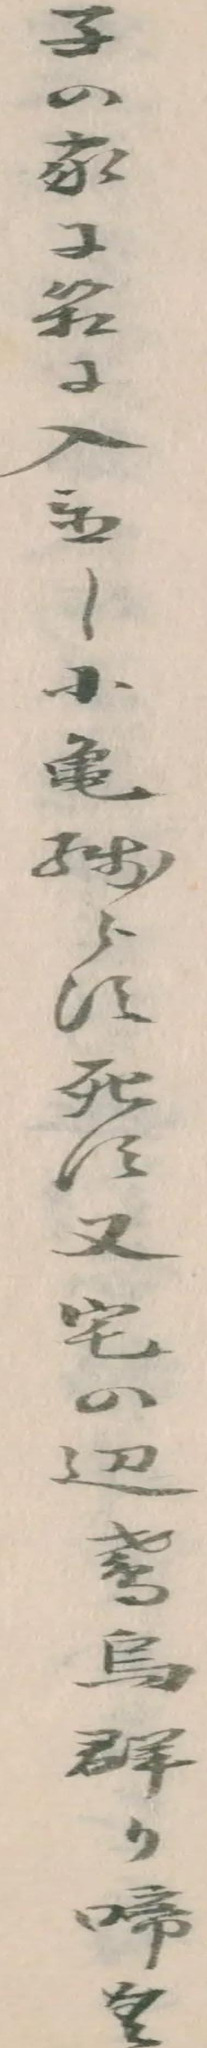子の家に箱に入置し小亀残らす死す又宅の辺鳶烏群り啼く
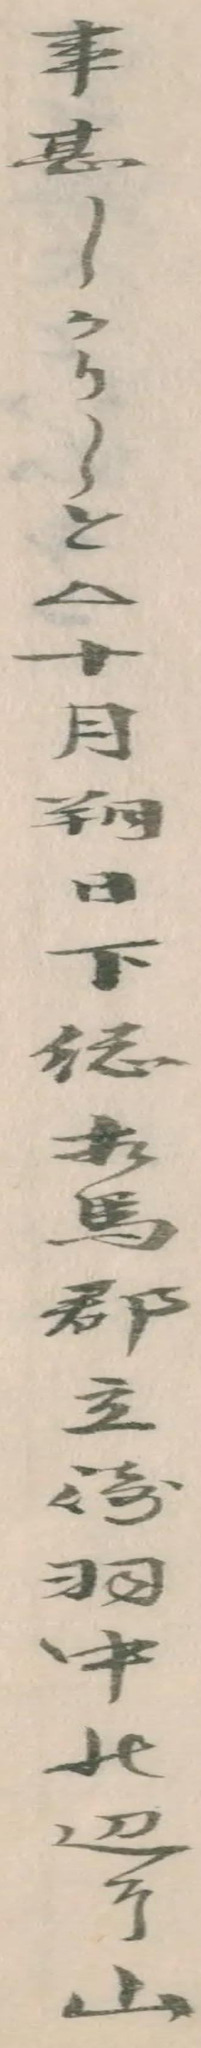事甚しかりしと△十月朔日下総相馬郡立崎羽中の辺に山
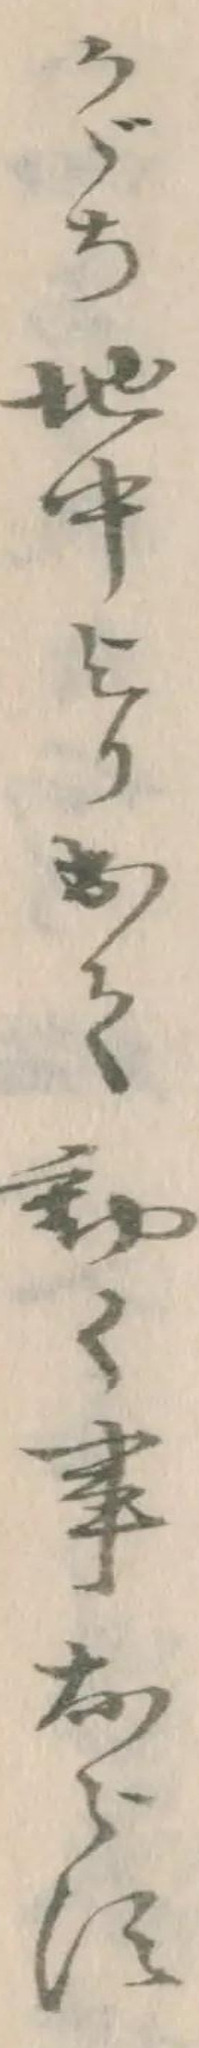うがち地中より出て動く事ならす

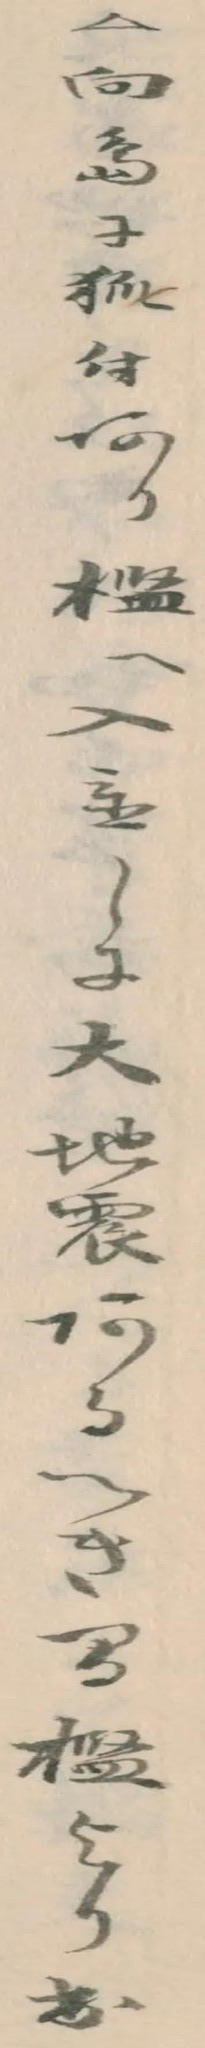△向島に狐付あり檻へ入置しに大地震あるへき間檻より出
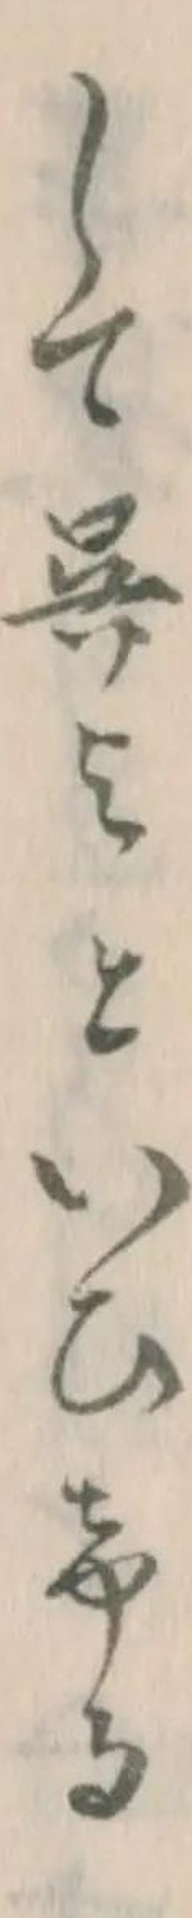して呉よといひける
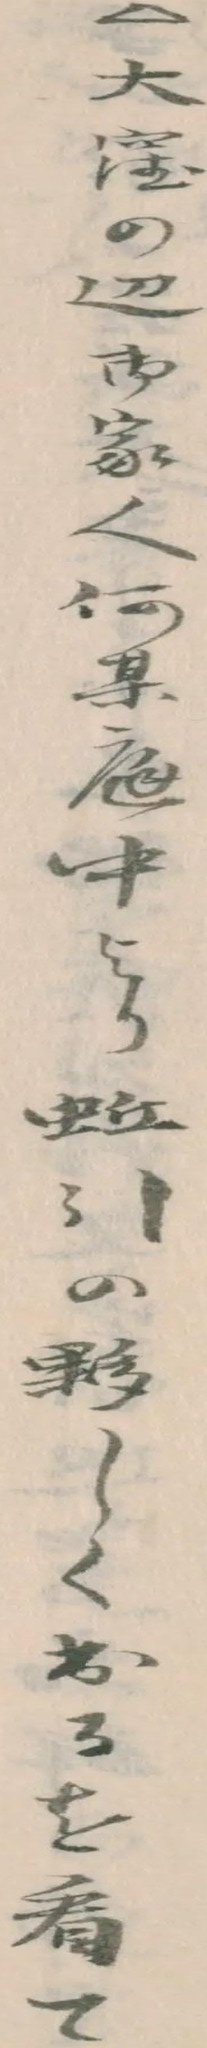△大窪の辺御家人何某庭中より蚯引の夥しく出るを看て
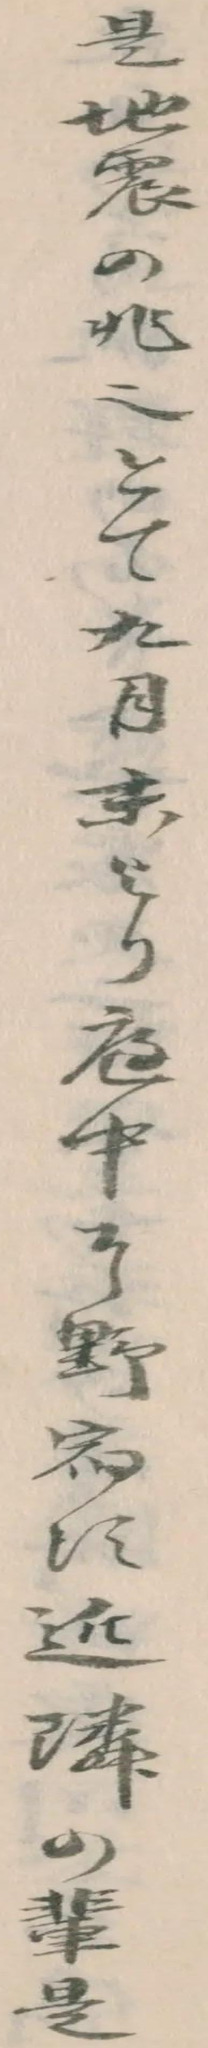是地震の兆也とて九月末より庭中に野宿す近隣の輩是
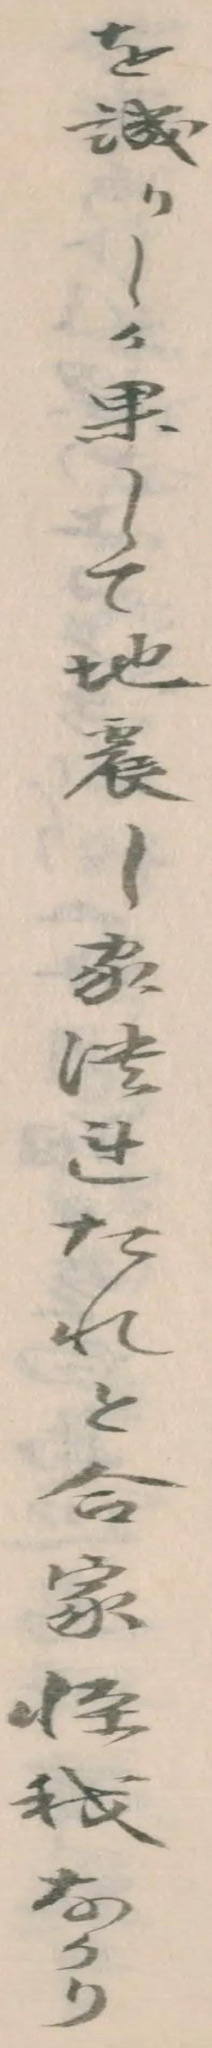を識りしか果して地震し家潰れたれと合家怪我なかり
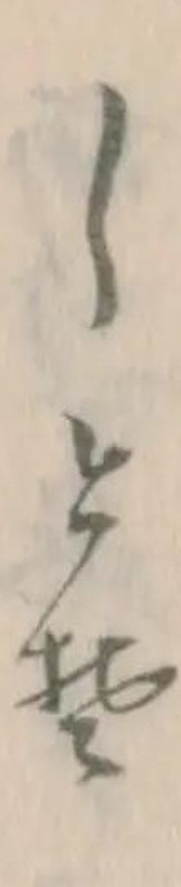しとそ
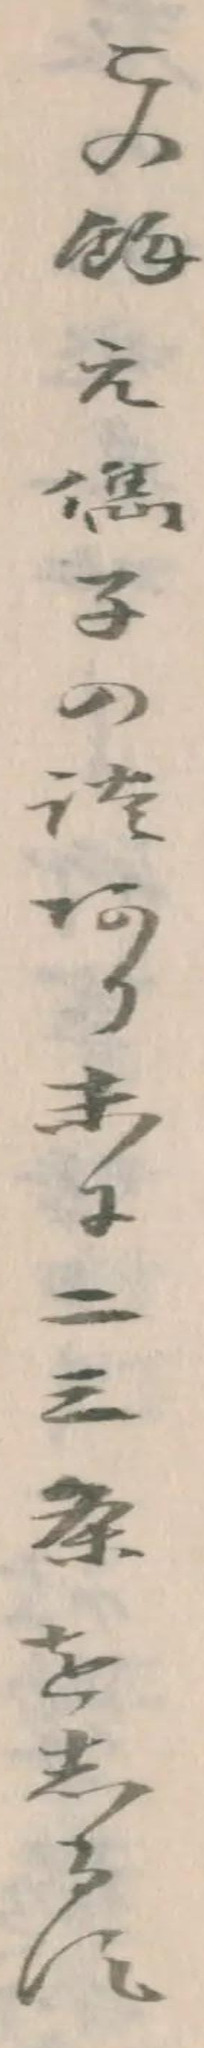この余元儁子の談あり未に二三条をしるす
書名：地災撮要. 巻7-9(地震之部)
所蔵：国立国会図書館 National Diet Library, JAPAN
